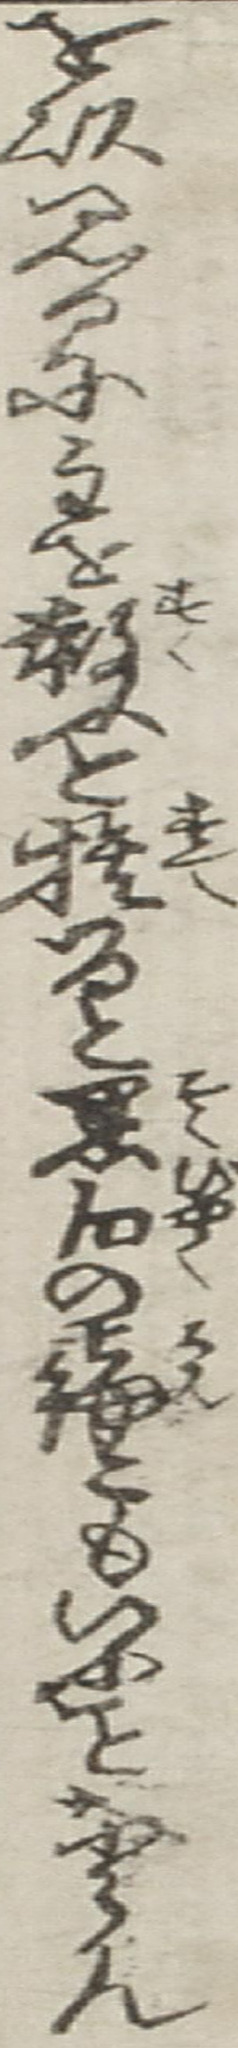を以見るに主を救ふと捨ると黒白の論ともいふことならん
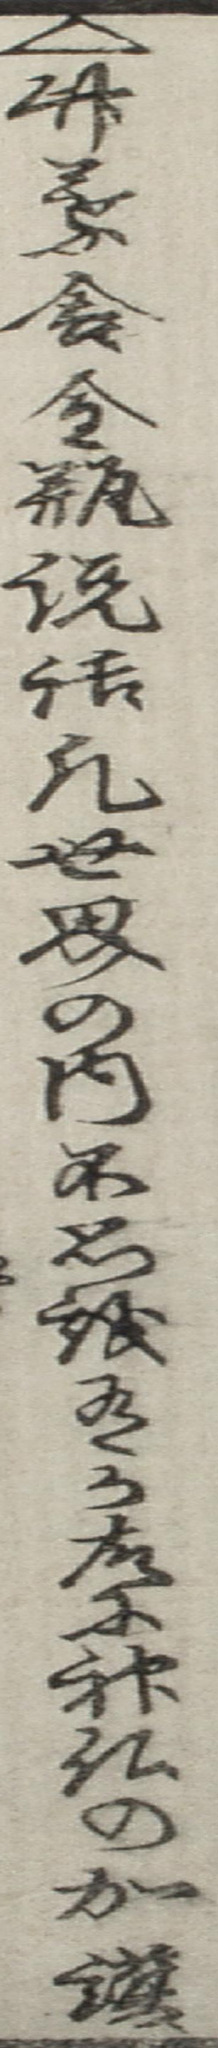△竹葉舎金瓶説話凡世界の内不思議有か故に神仏の加護
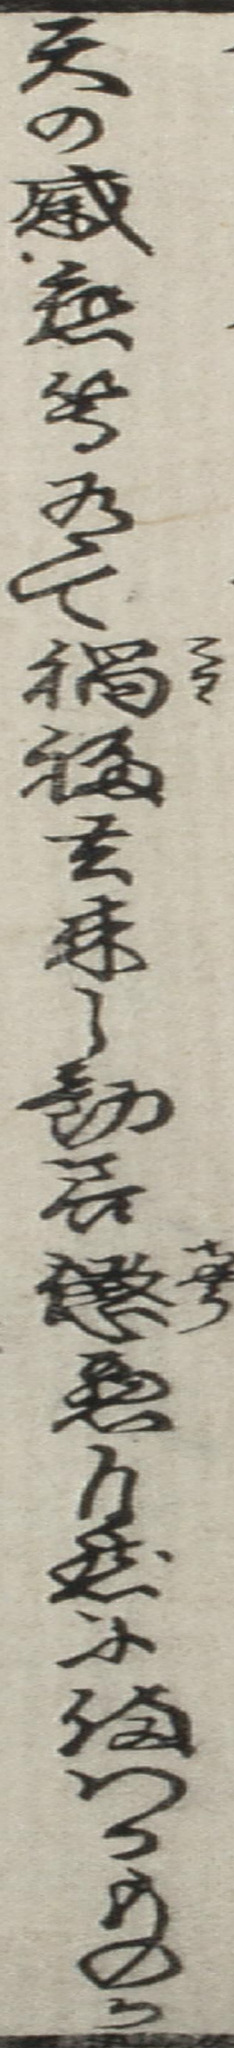天の感応等有て禍福去来し勧善懲悪自然に備はるものか
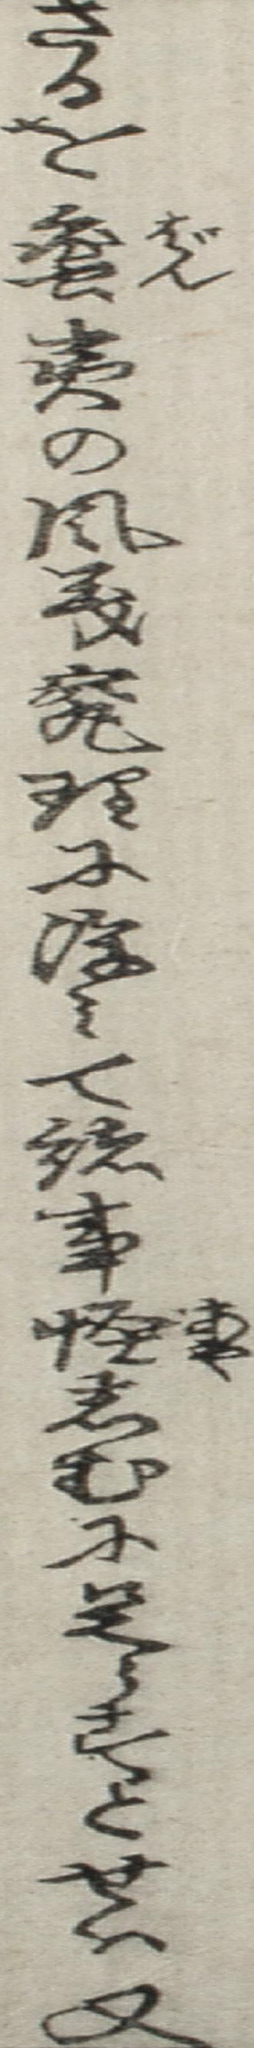さるを蛮夷の風義究理に染みて諸事怪しむに足らすとせは又
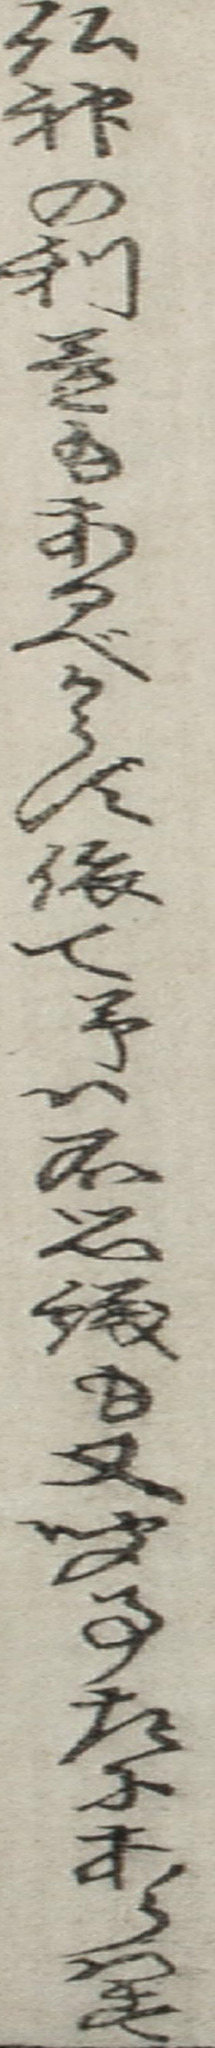仏神の利益もあるべからす依て予は不思議も又聞事左にあらはす
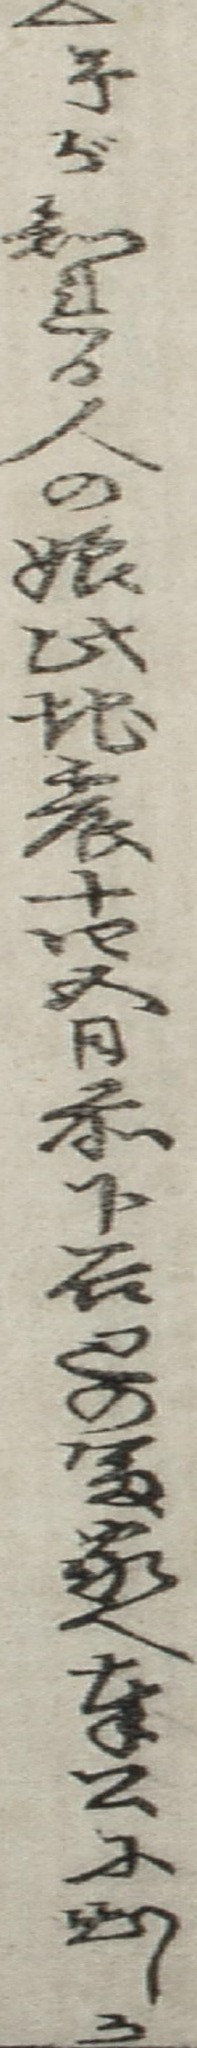△予が知れる人の娘此地震十四五日前下谷辺の富家へ奉公に出しか
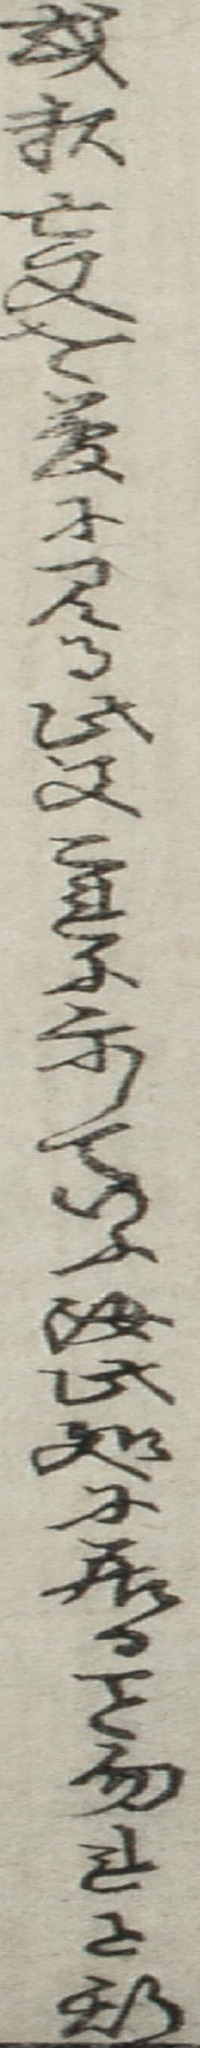或夜亡父を夢に見る此父これに示していふ汝此処に居ること勿れと斯
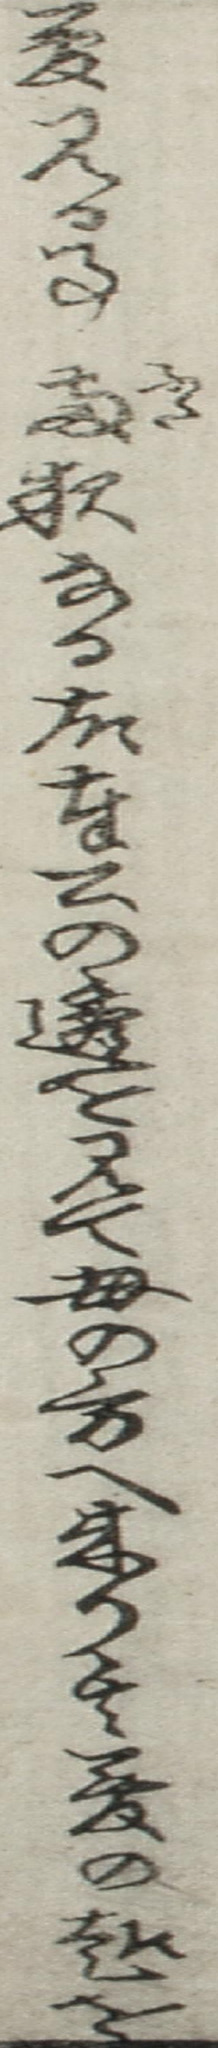夢見る事両夜なる故奉公の透を見て母の方へ来り其夢の趣を
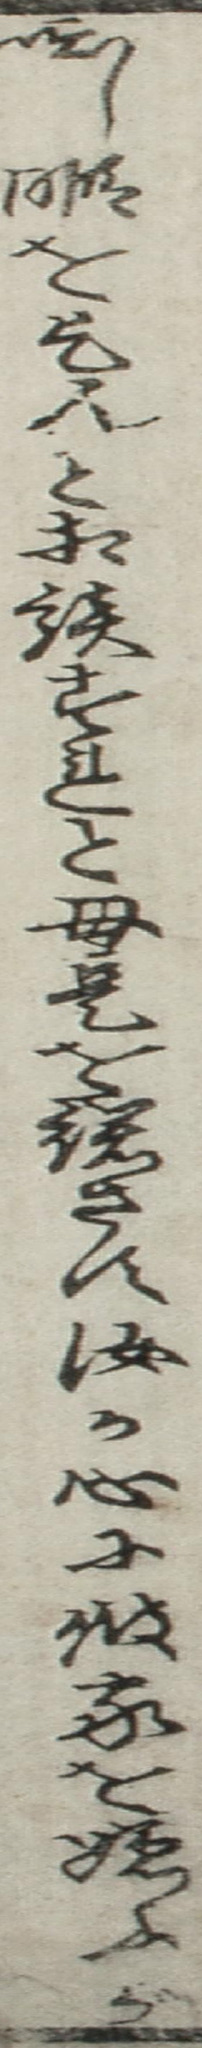咄し暇を乞んと相談すれと母是を諾さす汝か心に彼家を嫌ふが
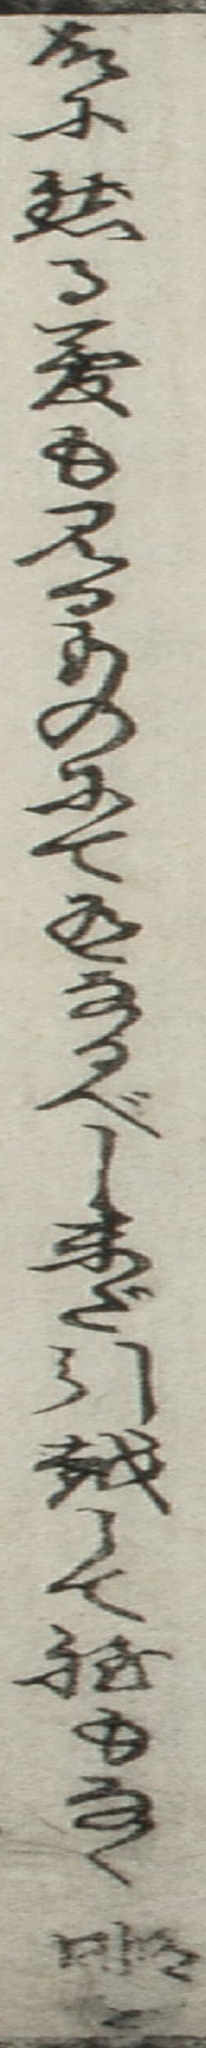故に然る夢も見るものにて有なるべし未だ引越して程もなく暇を
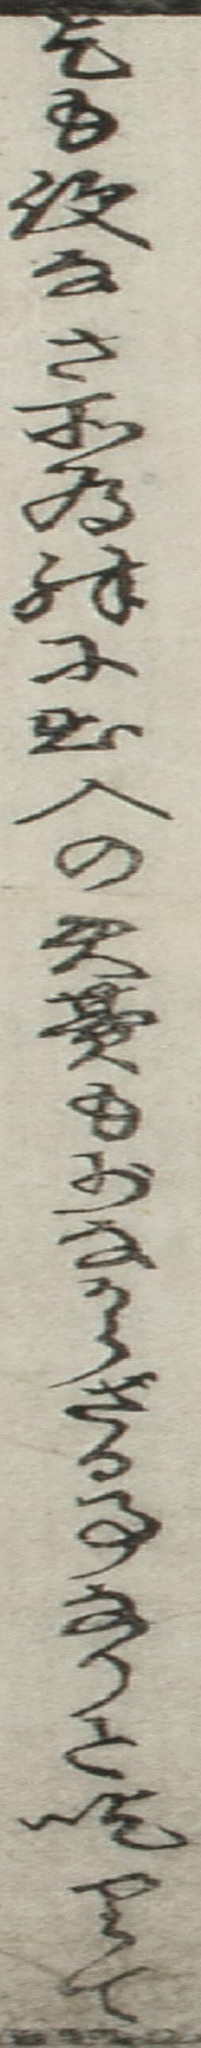乞も便なさ所為殊に出入の失費も少なからざる事なりと叱りて
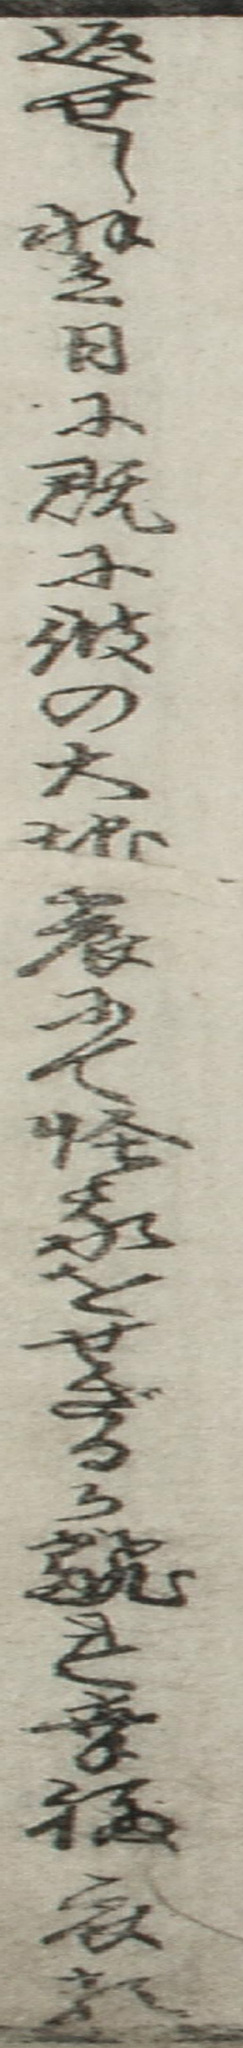返せし翌日に既に彼の大地震にて怪我をせざるか翻れ幸福衣類
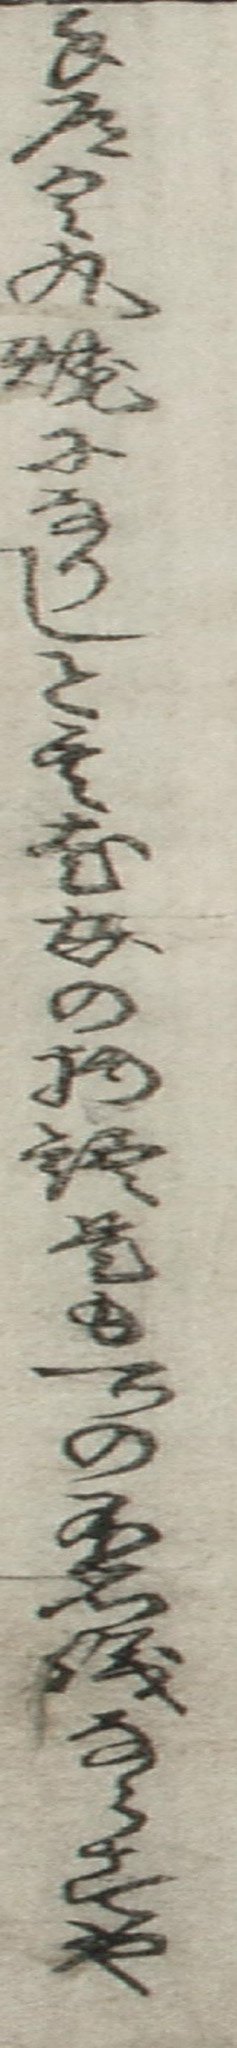手道具丸焼になりしと其老母の物語是も一つの不思議ならすや

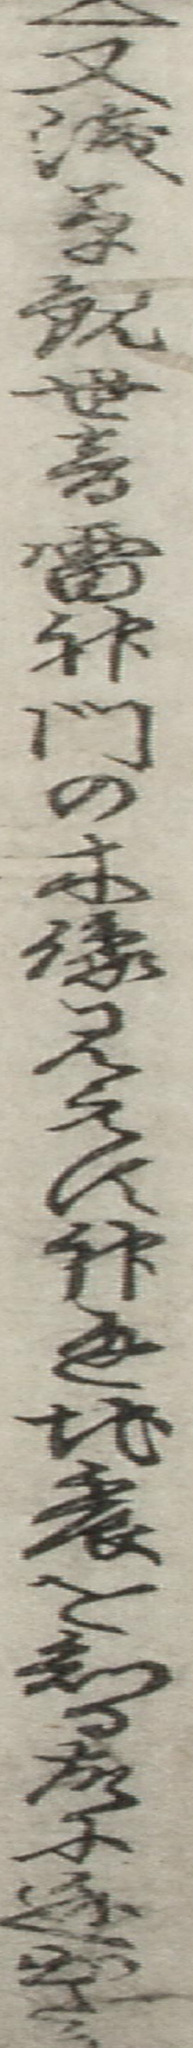△又浅草観世音雷神門の木像見えす神通地震を知る故に逃出たる
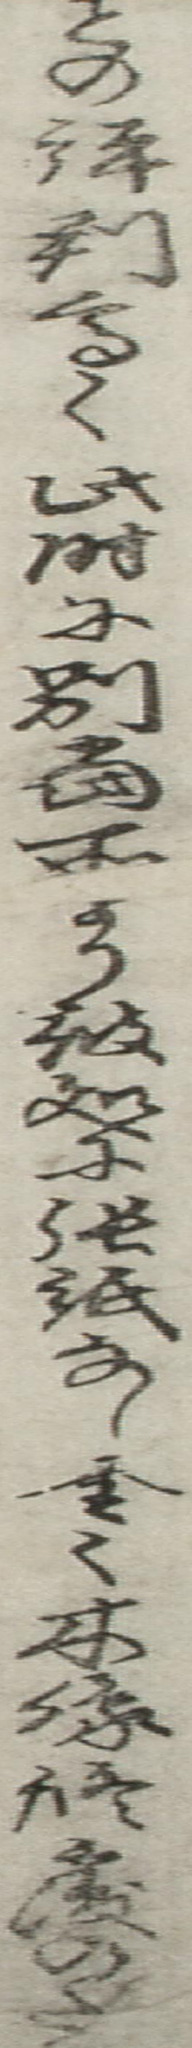ことの評判高く此時に別当所より彼処に貼紙なし全く木像修覆のため
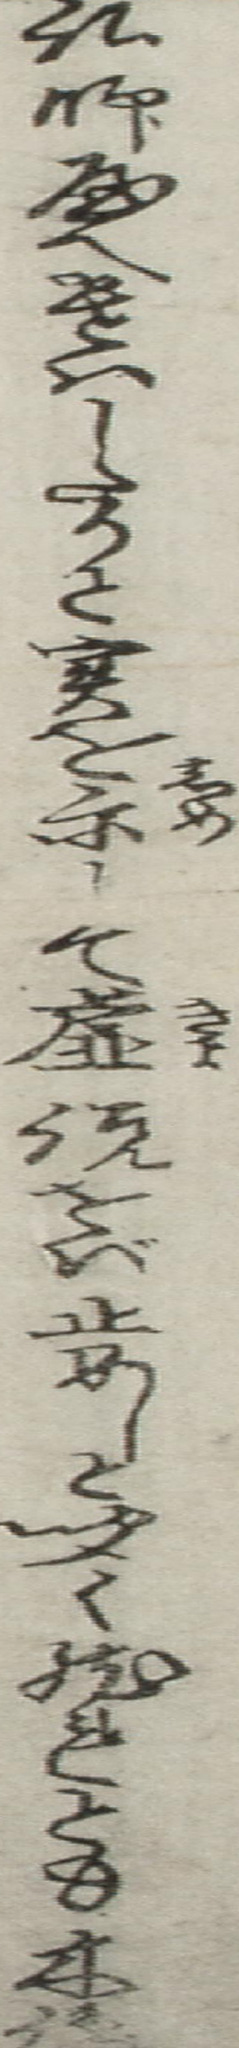仏師屋へ遣はしたりと実を示して虚説をば止めしと聞く然れとも木像
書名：安政見聞誌　下
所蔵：東京大学地震研究所図書室 Earthquake Research Institute Library, The University of Tokyo, JAPAN
